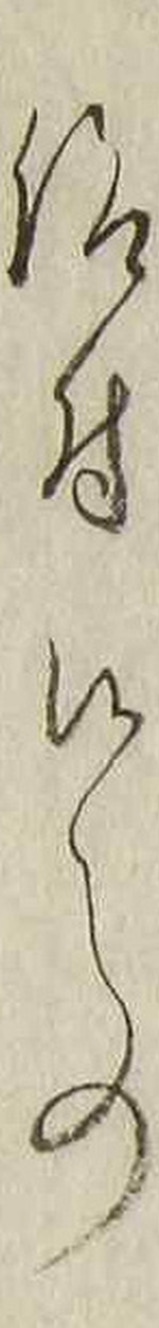仰付候事
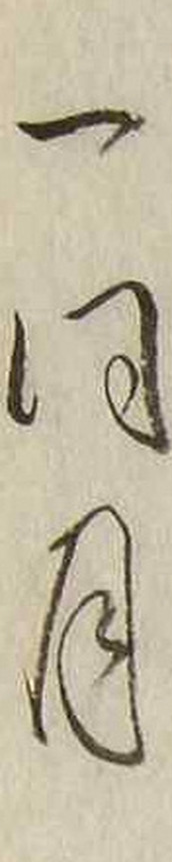一同月

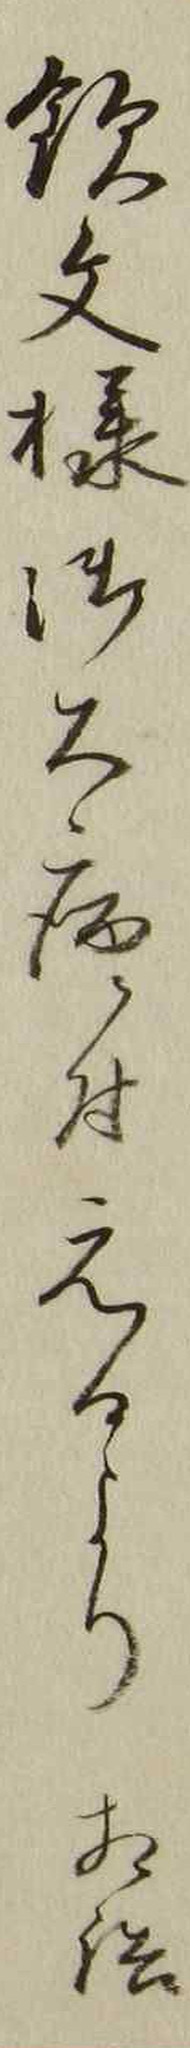欽文様御大病ニ付元日より相詰
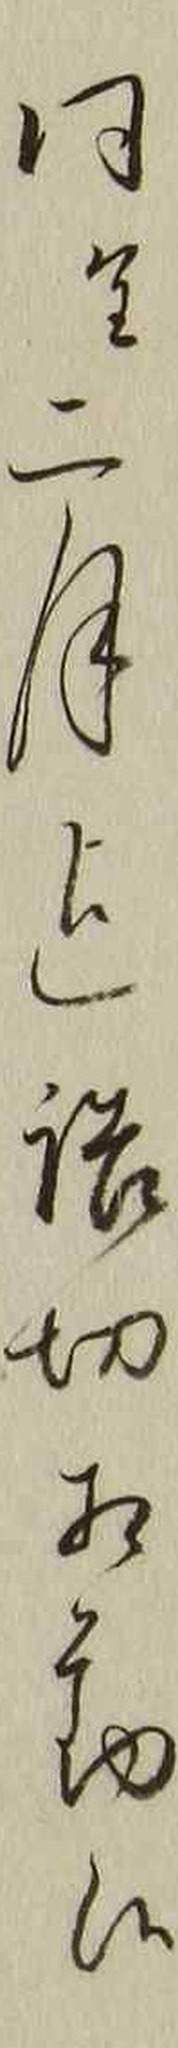同閏二月迄詰切相勤候
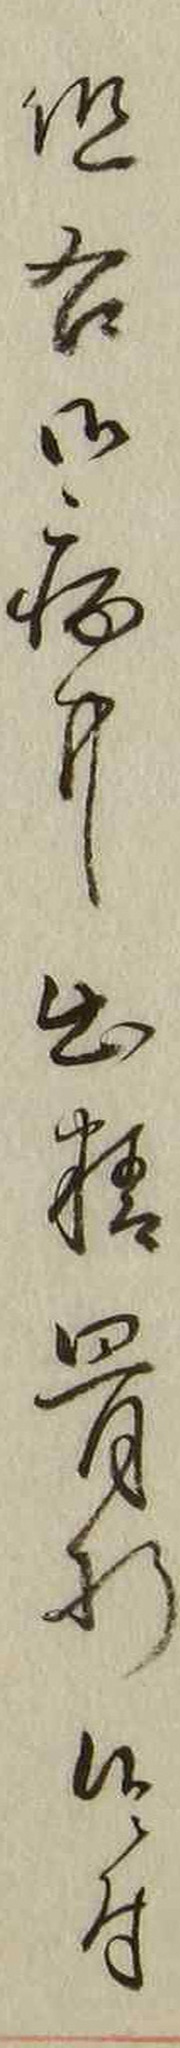但右御病中出精骨折候ニ付
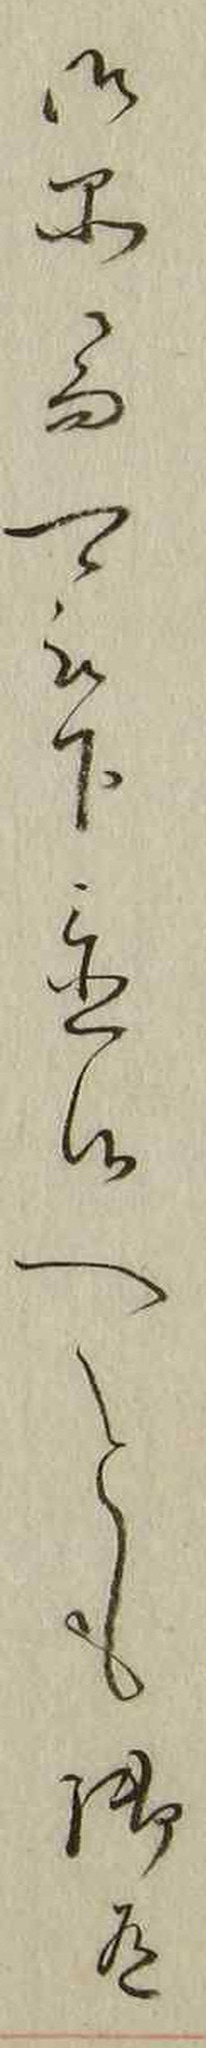御品ニ而可被下置候へとも御有
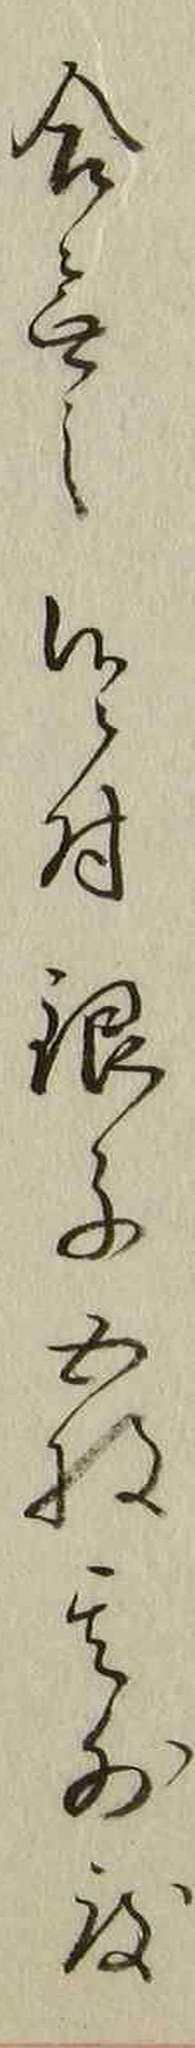合無之候ニ付銀子五枚其外度
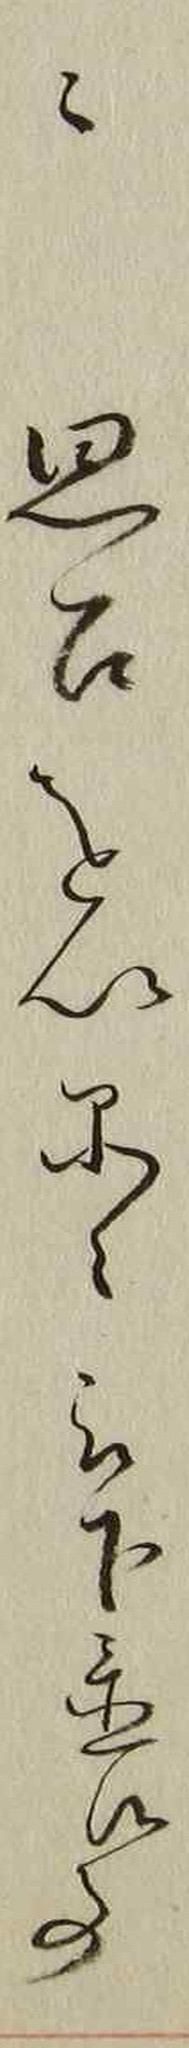々思召を以品々被下置候事
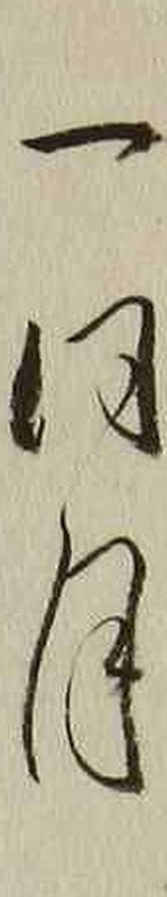一同月
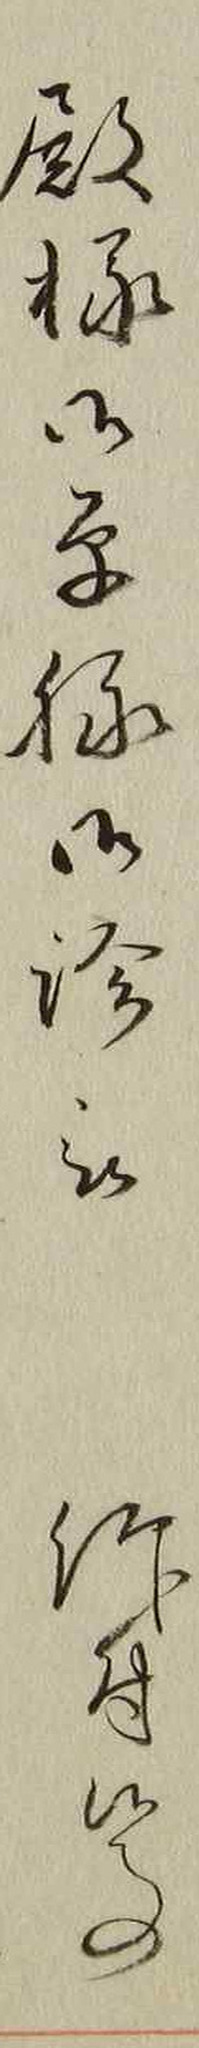殿様御平脈御診被仰付候事
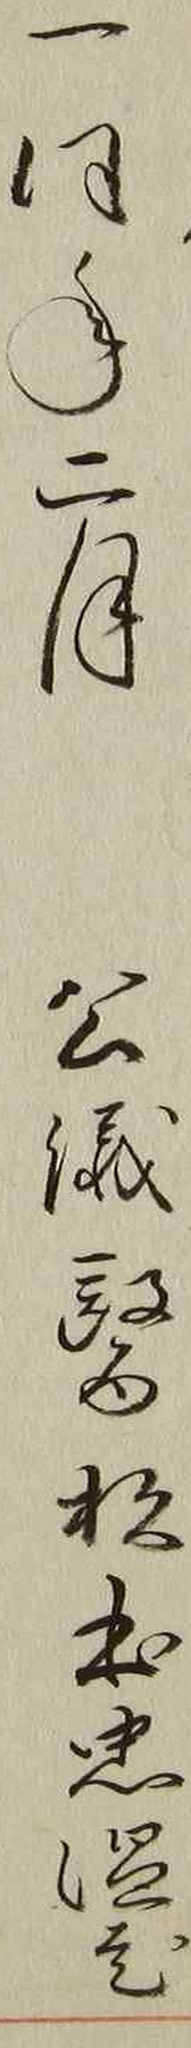一同年二月公儀医杉本忠温老
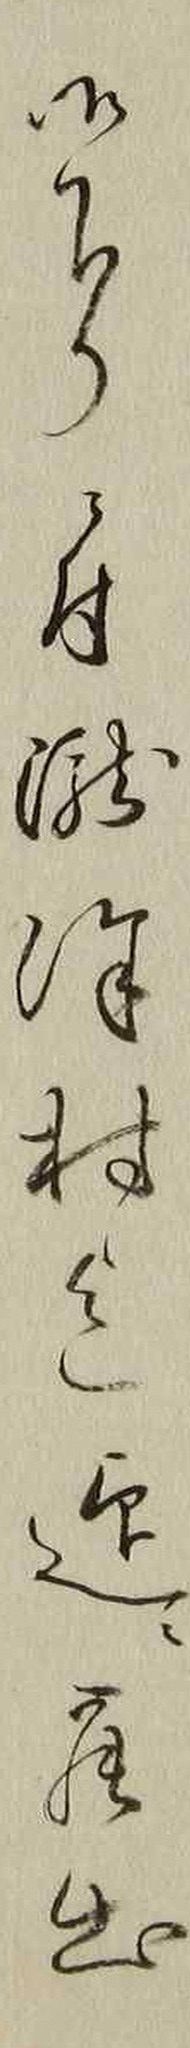御下りニ付瀧沢村迄迎ニ罷出
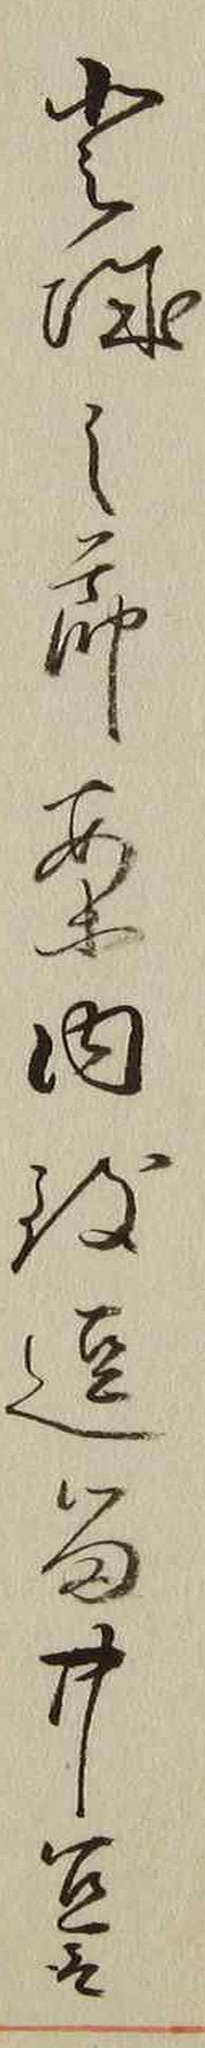登城之節案内致逗留中宜取
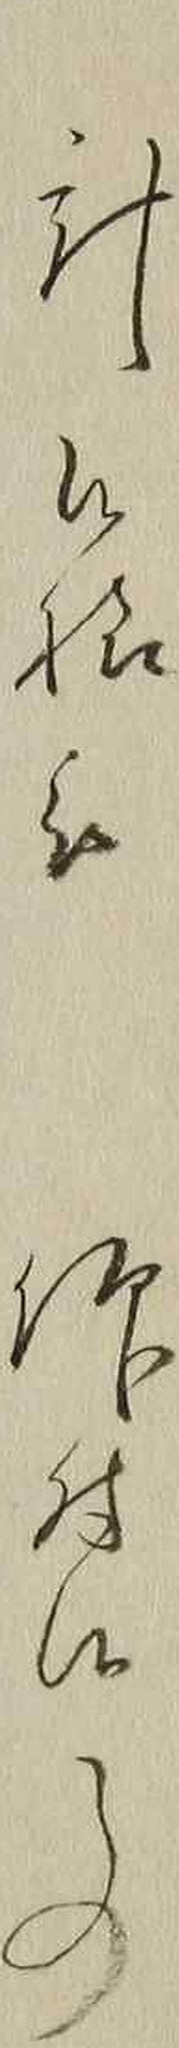計候様被仰付候事
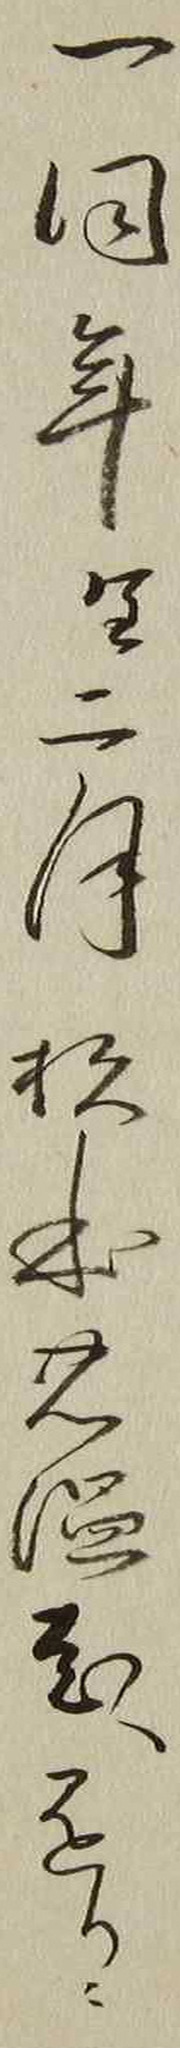一同年閏二月杉本忠温老へ懸りニ
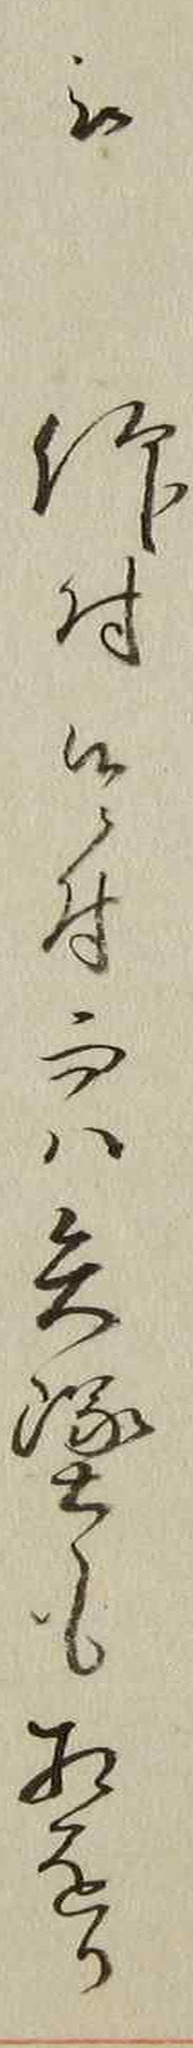被仰付候ニ付而ハ失墜も相懸り
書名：諸士系譜　巻之8　い之部8
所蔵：会津若松市立会津図書館
